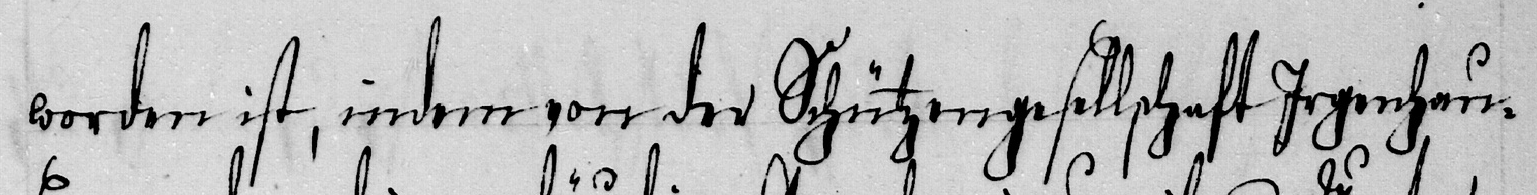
worden ist, indem von der Schützengesellschaft Irgenhau¬
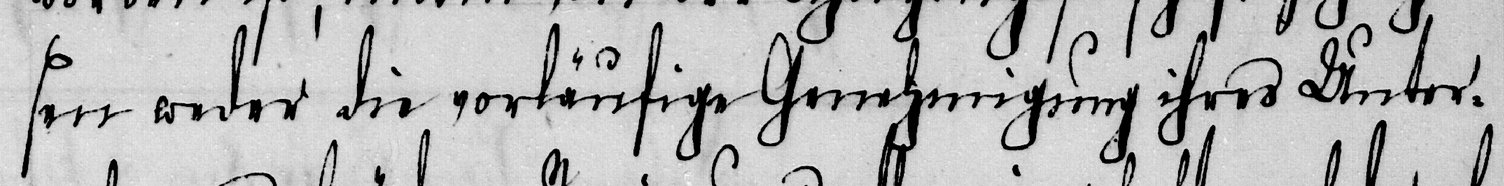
sen weder die vorläufige Genehmigung ihres Unter¬
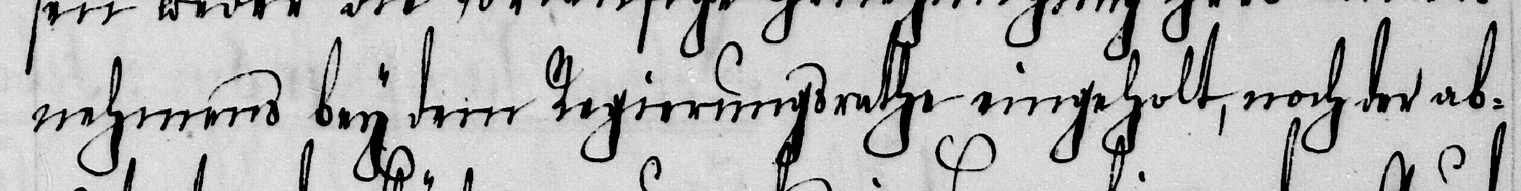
nehmens bey dem Regierungsrathe eingeholt, noch der ab¬
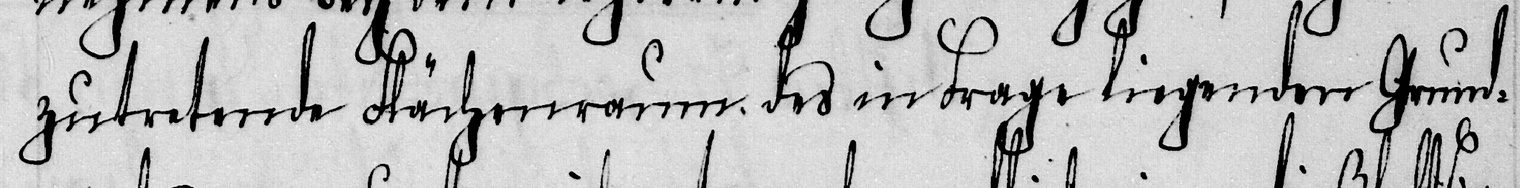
zutretende Flächenraum des in Frage liegenden Grund¬
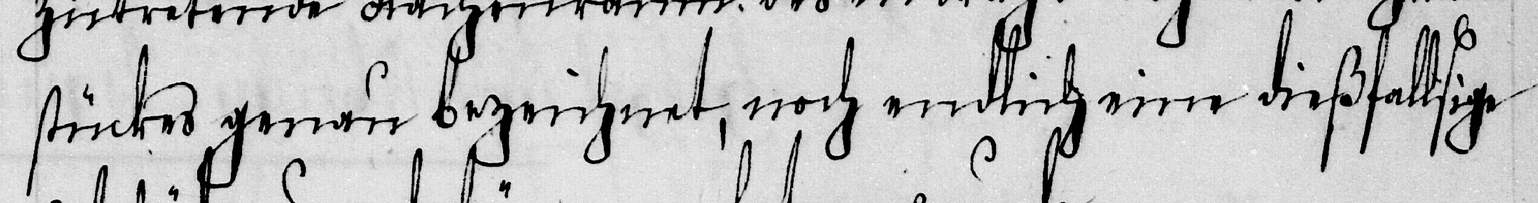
stückes genau bezeichnet, noch endlich eine dießfällige
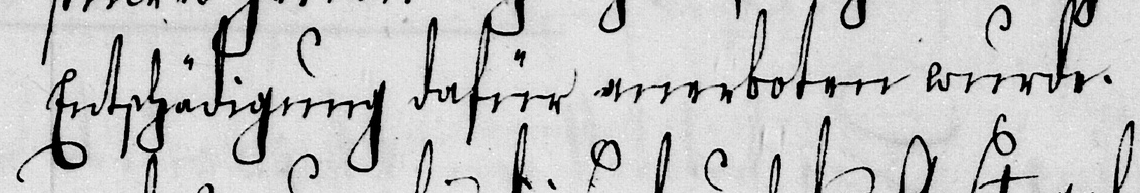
Entschädigung dafür angeboten wurde.
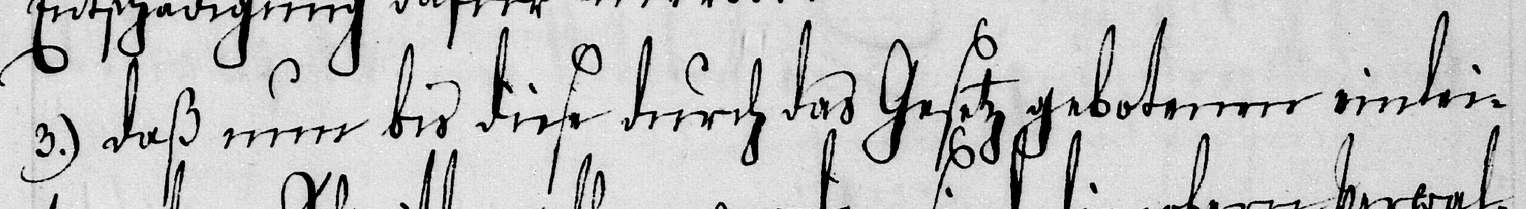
3.) daß nun bis diese durch das Gesetz gebotenen einlei¬
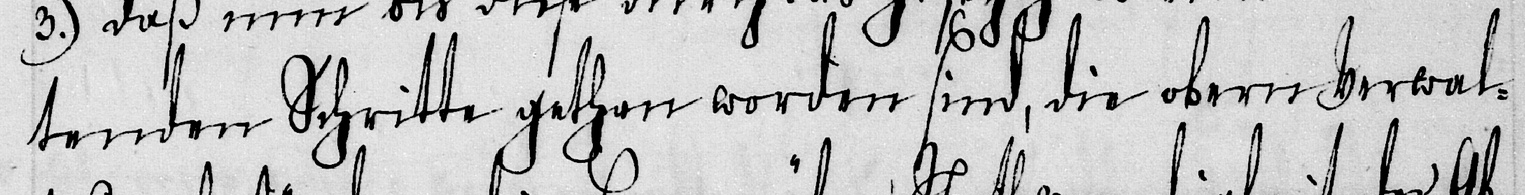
tenden Schritte gethan worden sind, die obern Verwal¬
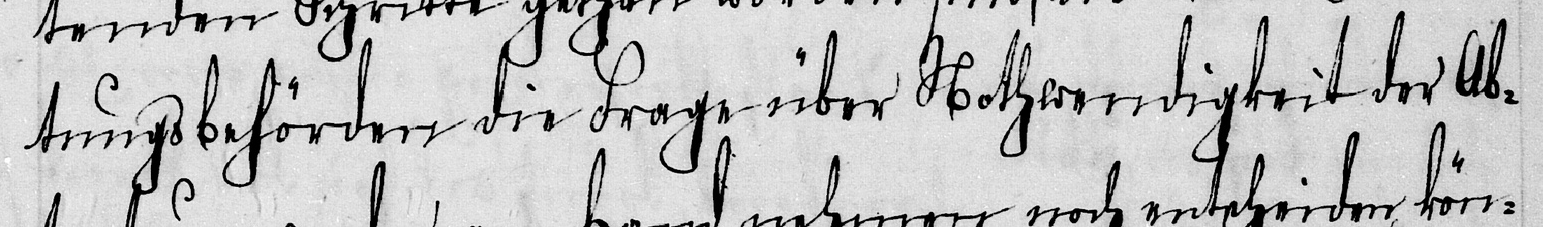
tungsbehörden die Frage über Nothwendigkeit der Ab¬
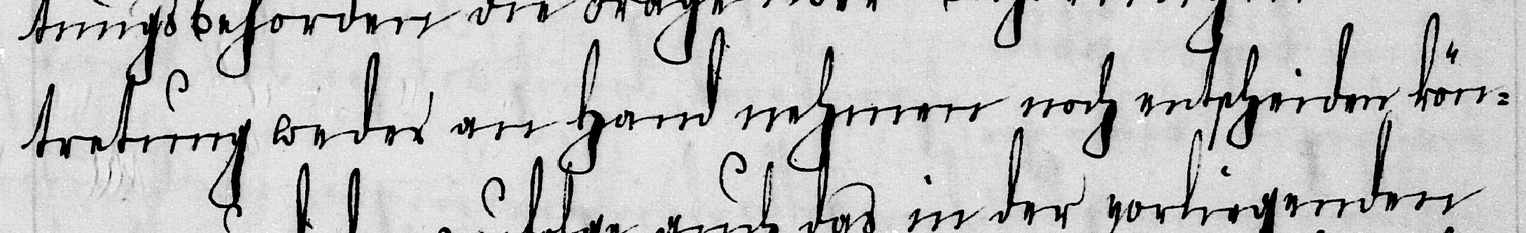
tretung weder an Hand nehmen noch entscheiden kön¬
